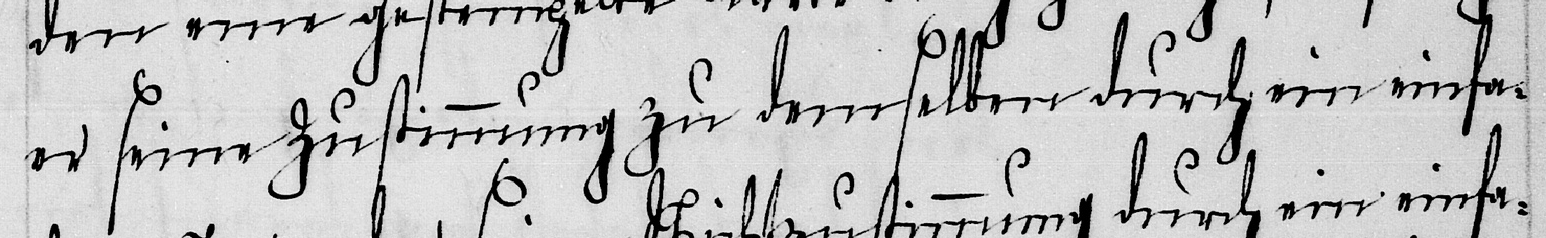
er seine Zustimmung zu demselben durch ein einfa¬
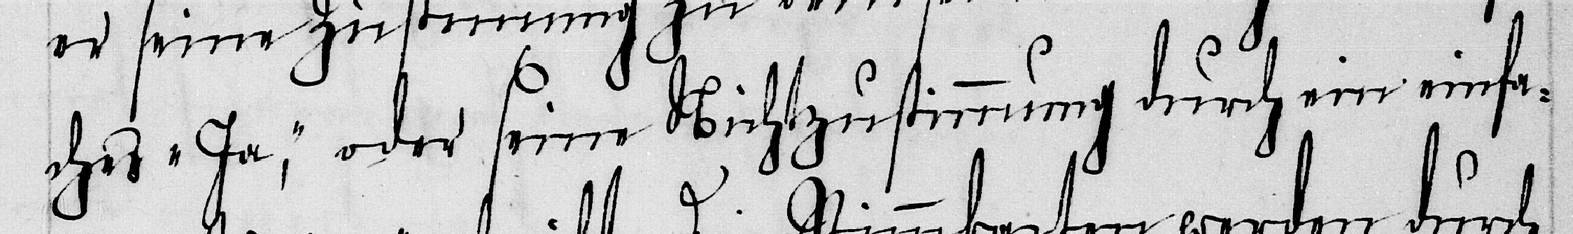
ches „Ja“, oder seine Nichtzustimmung durch ein einfa¬
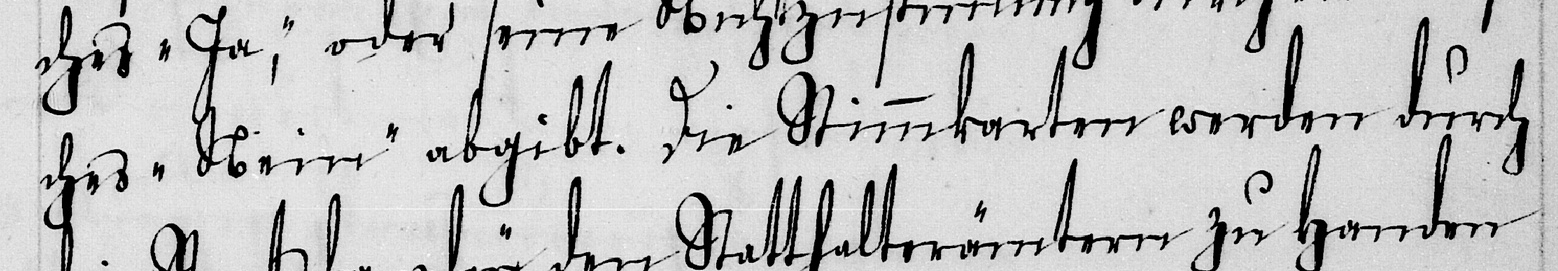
ches „Nein“ abgibt. Die Stimmkarten werden durch
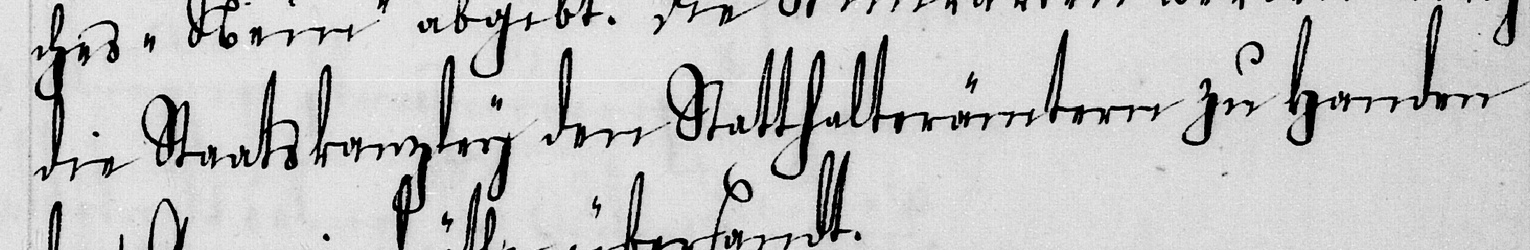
die Staatskanzley den Statthalterämtern zu Handen
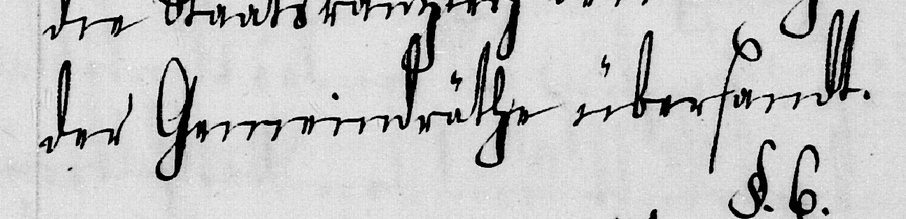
der Gemeindräthe übersandt.
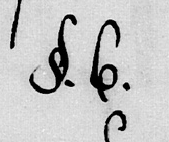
§. 6.
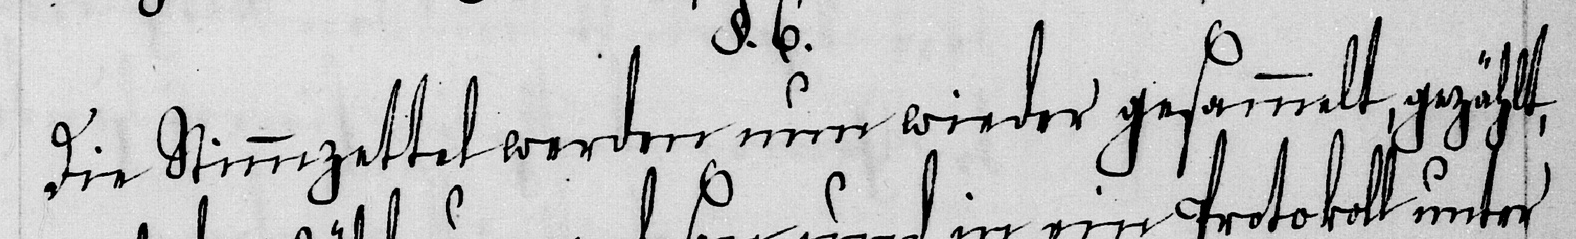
Die Stimmzettel werden nun wieder gesammelt, gezählt,
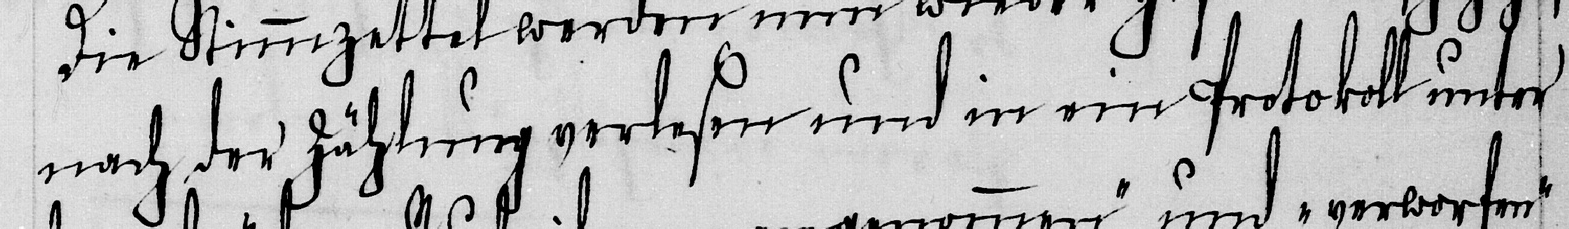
nach der Zählung verlesen und in ein Protokoll unter
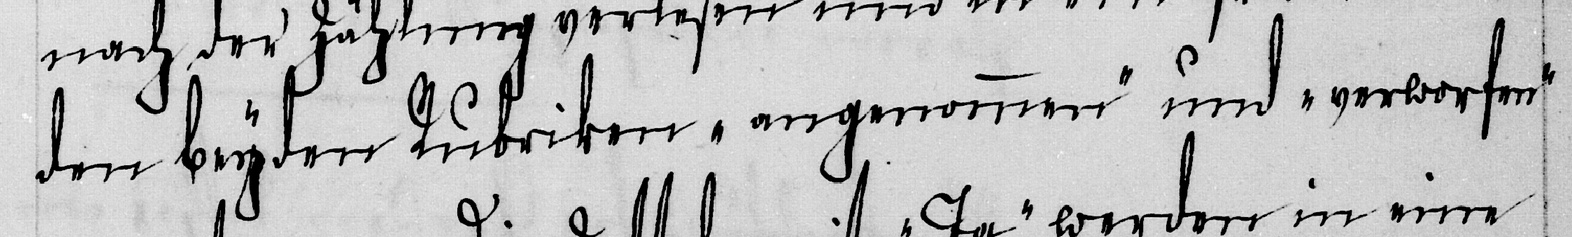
den beyden Rubriken „angenommen“ und „verworfen“
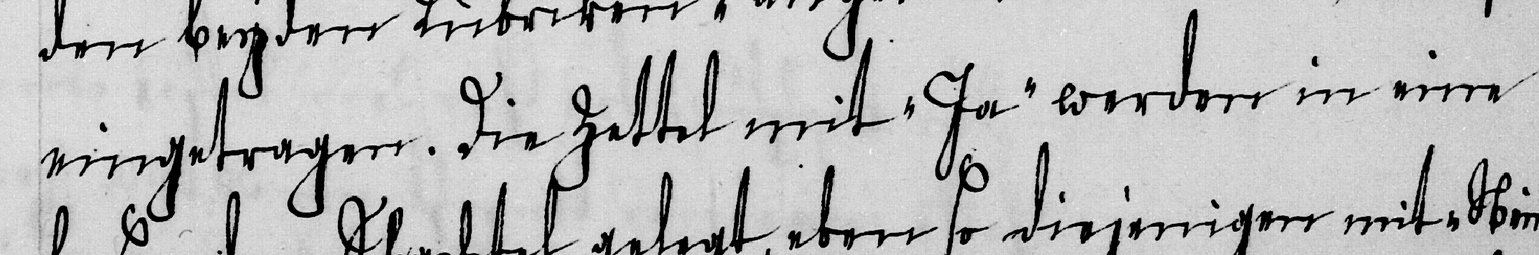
eingetragen. Die Zettel mit „Ja“ werden in eine
